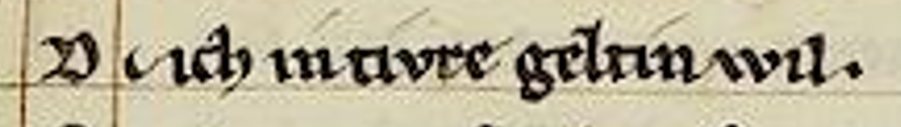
D(az) ich in tivre geltin wil.
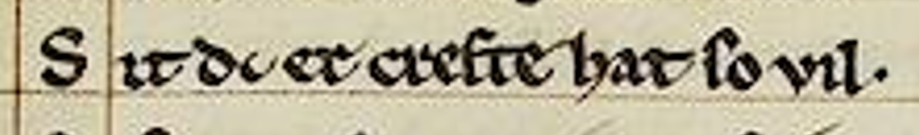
Sit d(az) er crefte hat ſo vil.
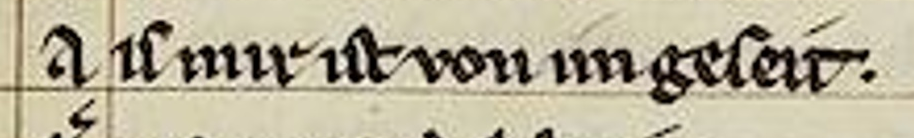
Alſ mir iſt von im geſeit.
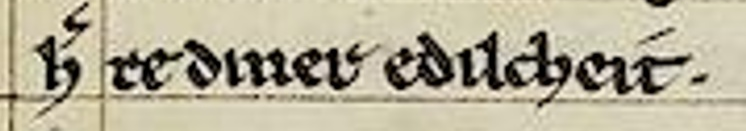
H(er)re diner edilcheit.
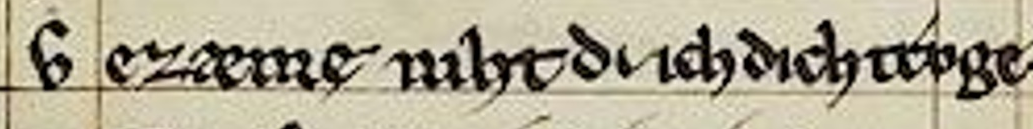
Gez[ae]me niht d(az) ich dich trvge.
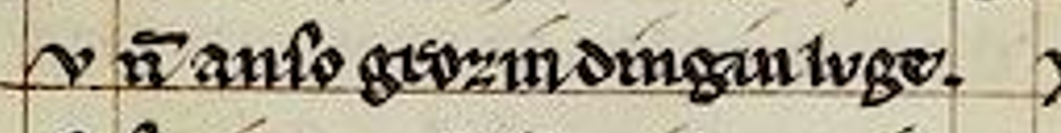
Vn(d) anſo grozin dingin lvge.
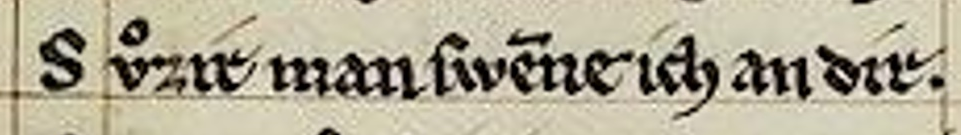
Sv°ozir man ſwe(n)ne ich an dir.
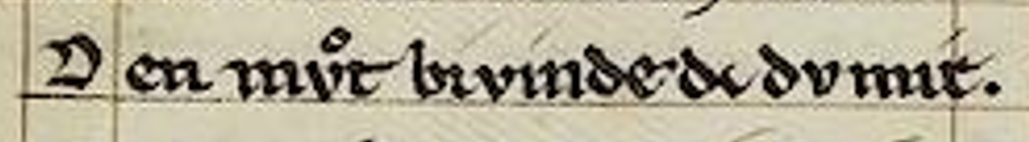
Den mv°ot bivinde d(az) dv mir.
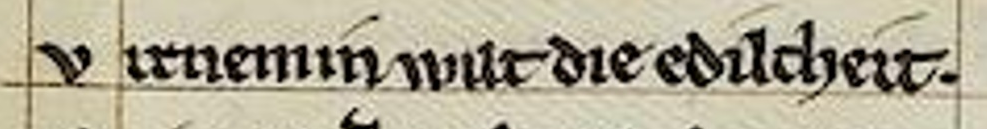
Virnemin wilt die edilcheit.
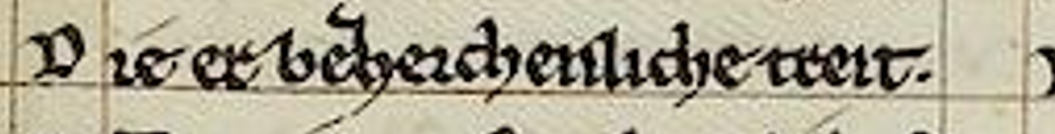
Die er be?eichenliche treit.
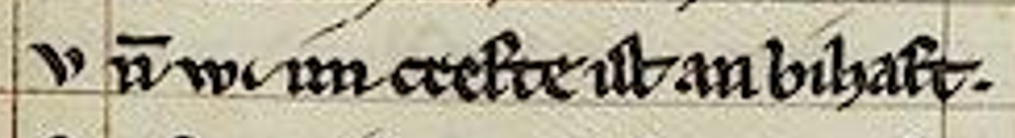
Vn(d) w(az) im crefte iſt an bihaft.
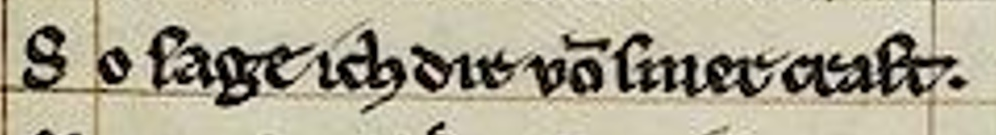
So ſage ich dir vo(n) ſiner craft.
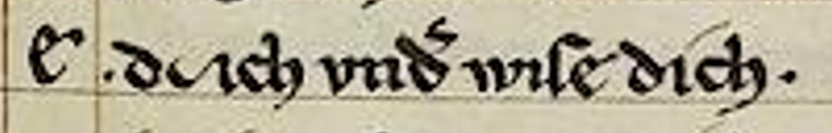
E. d(az) ich vnd(er) wiſe dich.
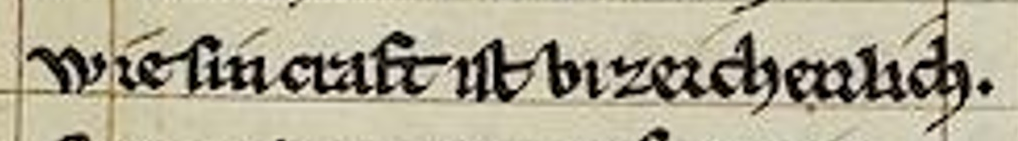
Wie ſin craft iſt bizeichenlich.
